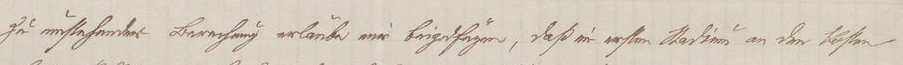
Zu umstehender Berechnung erlaube mir beizufügen, daß im ersten Stadium an den Kosten
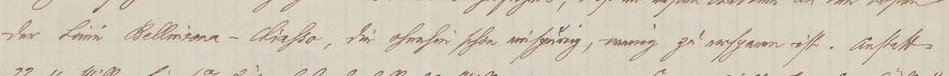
der Linie Bellinzona – Chiasso, die ohnehin schon einspurig, wenig zu ersparen ist. Anstatt
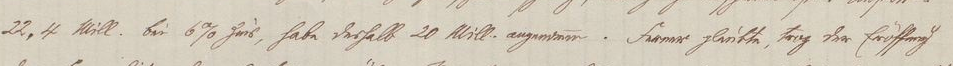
22,4 Mill. bei 6% Zins, habe deshalb 20 Mill. angenommen. Ferner glaubte, troz der Eröffnung
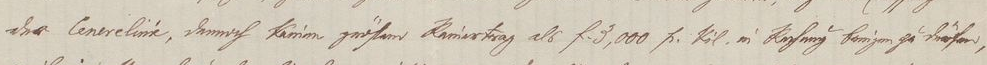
der Cenerelinie, dennoch keinen größern Reinertrag als f. 3,000 p. Kil. in Rechnung bringen zu dürfen,
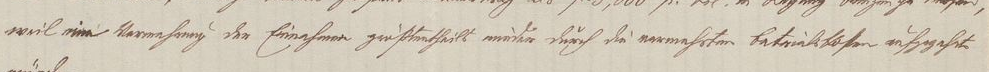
weil eine Vermehrung der Einnahmen größtentheils wieder durch die vermehrten Betriebskosten aufgezehrt
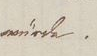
würde.
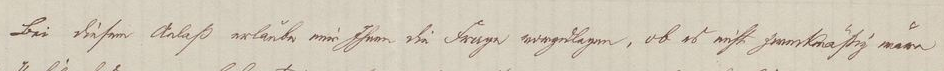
Bei diesem Anlaß erlaube mir Ihnen die Frage vorzulegen, ob es nicht zweckmäßig wäre
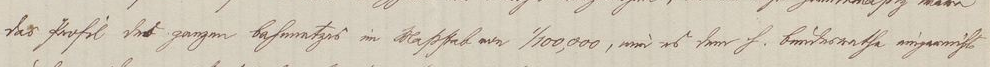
das Profil des ganzen Bahnnetzes im Maßstab von 1/100,000, wie es dem H. Bundesrathe eingereicht
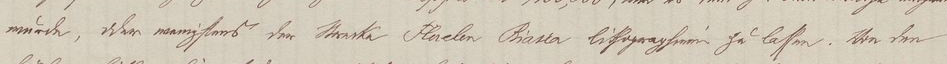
wurde, oder wenigstens der Strecke FlüelenBiasca lithographiren zu lassen. Von den
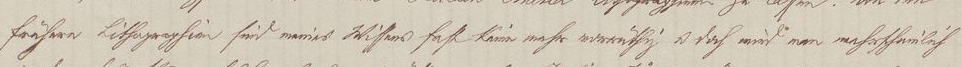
frühern Lithographien sind meines Wissens fast keine mehr vorräthig & doch wird man wahrscheinlich
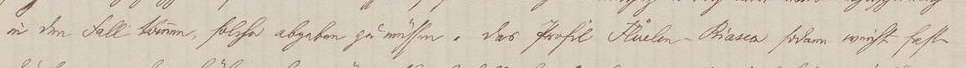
in den Fall kommen, solche abgeben zu müssen. Das Profil Flüelen – Biasca sodann weicht fast
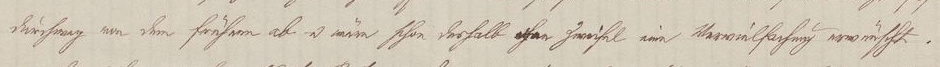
durchweg von den frühern ab & wäre schon deshalb ohne Zweifel eine Vervielfachung erwünscht.
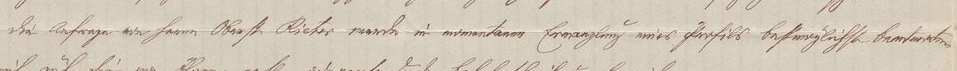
Die Anfrage an Herrn Oberst Rieter werde in momentaner Ermanglung eines Profils bestmöglichst beantworten
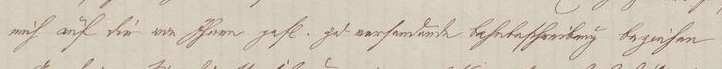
mich auf die von Ihnen gefl. zu versendende Bahnbeschreibung beziehen.
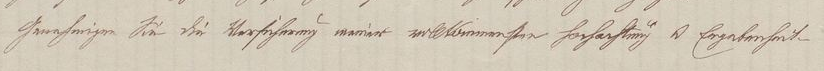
Genehmigen Sie die Versicherung meiner vollkommensten Hochachtung u Ergebenheit
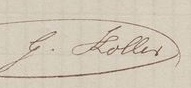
G. Koller
